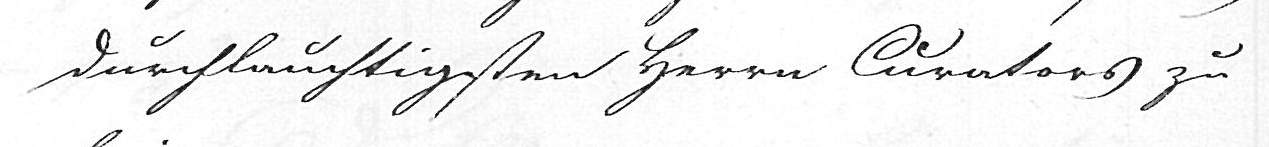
durchlauchtigsten Herrn Curators zu
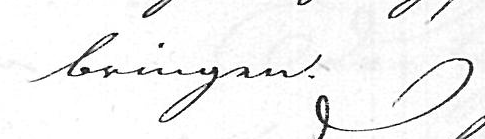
bringen.
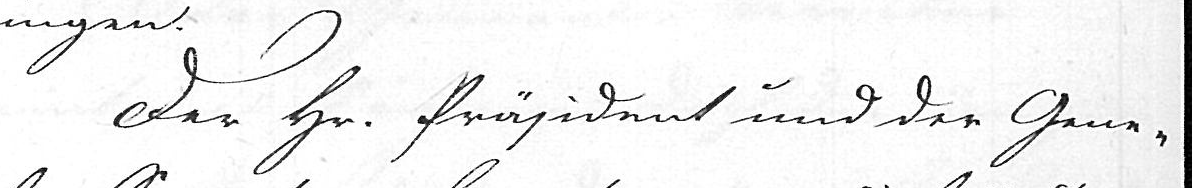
Der Hr. Präsident und der Gene-
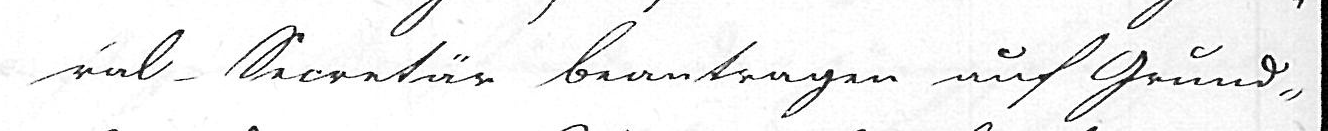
ral-Secretär beantragen auf Grund-
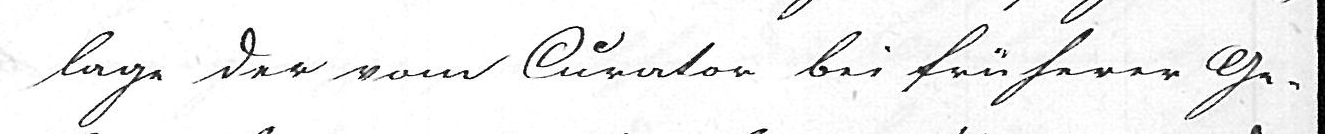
lage der vom Curator bei früherer Ge-
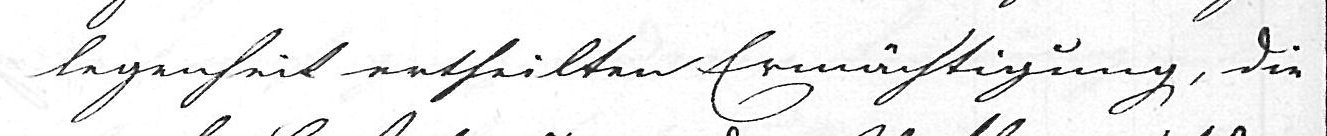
legenheit ertheilten Ermächtigung, die
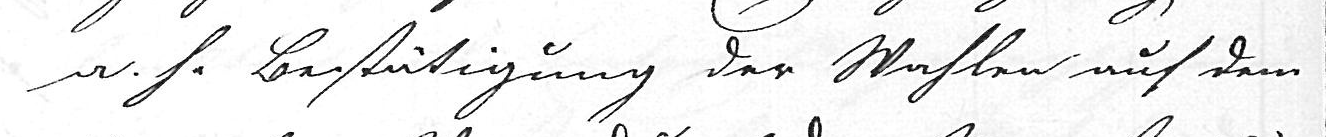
a. h. Bestätigung der Wahlen auf dem
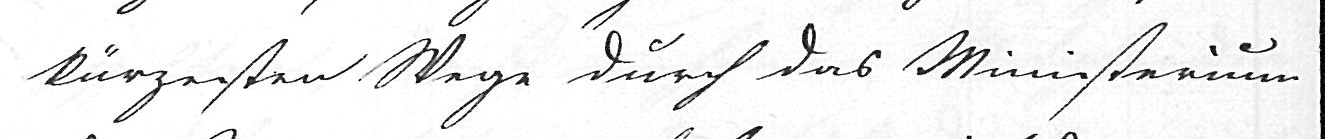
kürzesten Wege durch das Ministerium
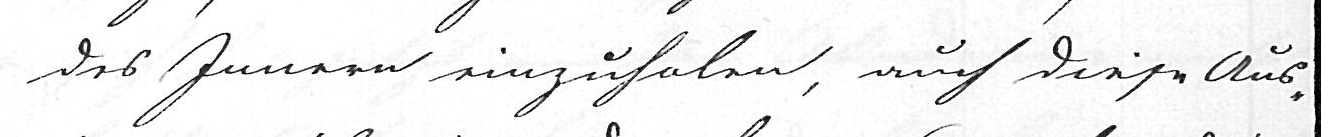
des Innern einzuholen, auch diese Aus-
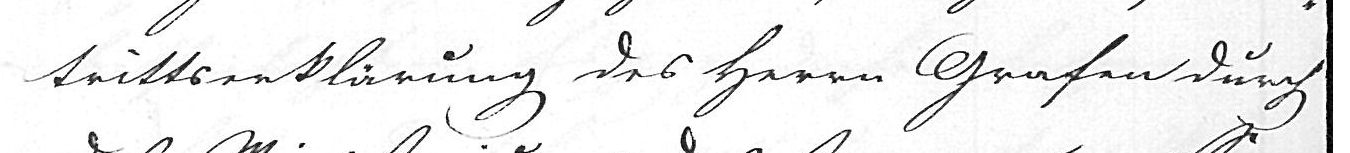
trittserklärung des Herrn Grafen durch
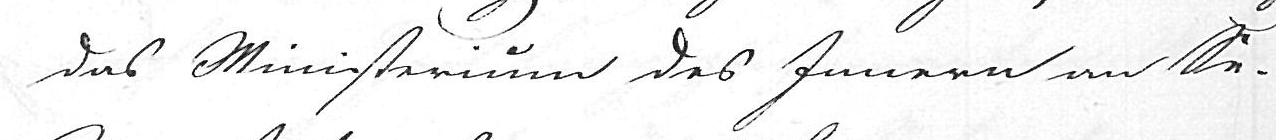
das Ministerium des Innern an Se.
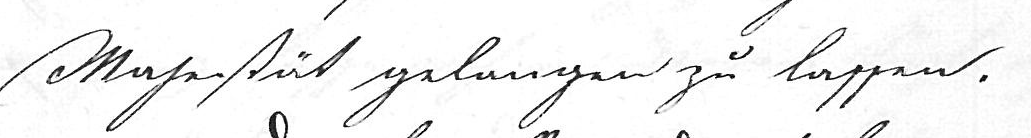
Majestät gelangen zu lassen.
